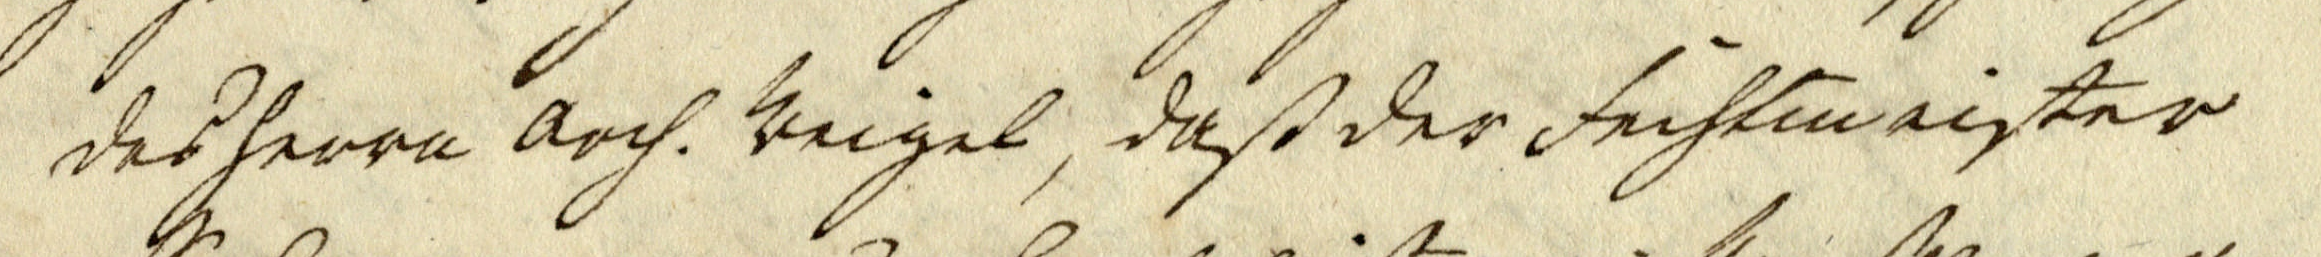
des Herrn Arch. Weigel, daß der Fechtmeister
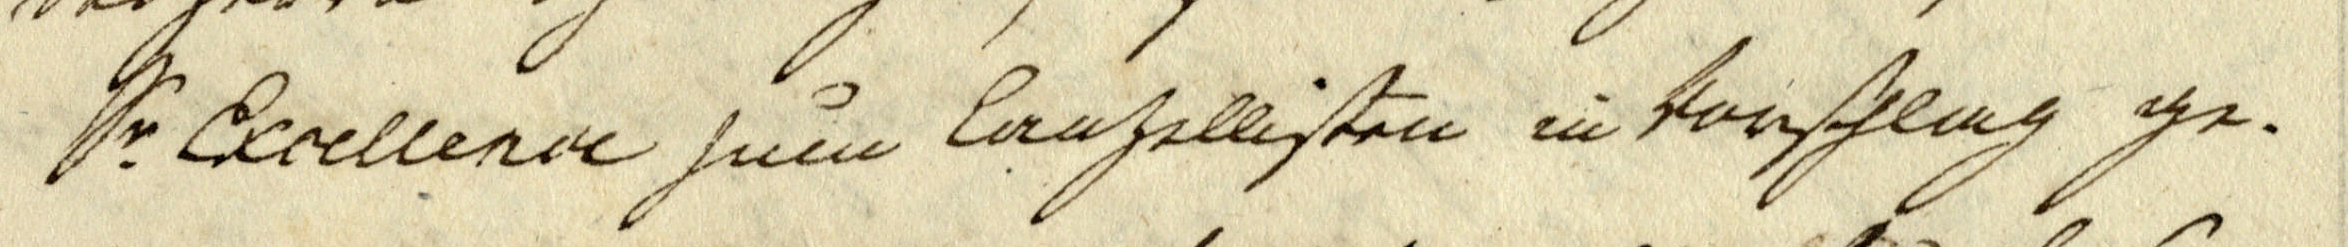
Sr Excellence zum Canzellisten in Vorschlag ge¬
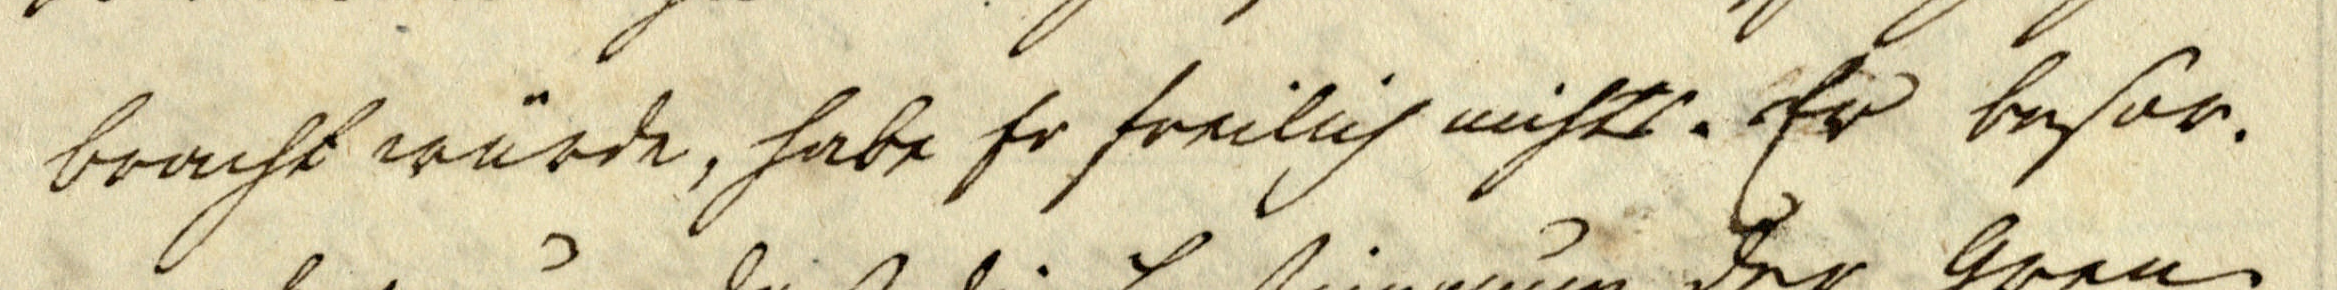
bracht würde, habe Er freilich nichts: Er besor¬
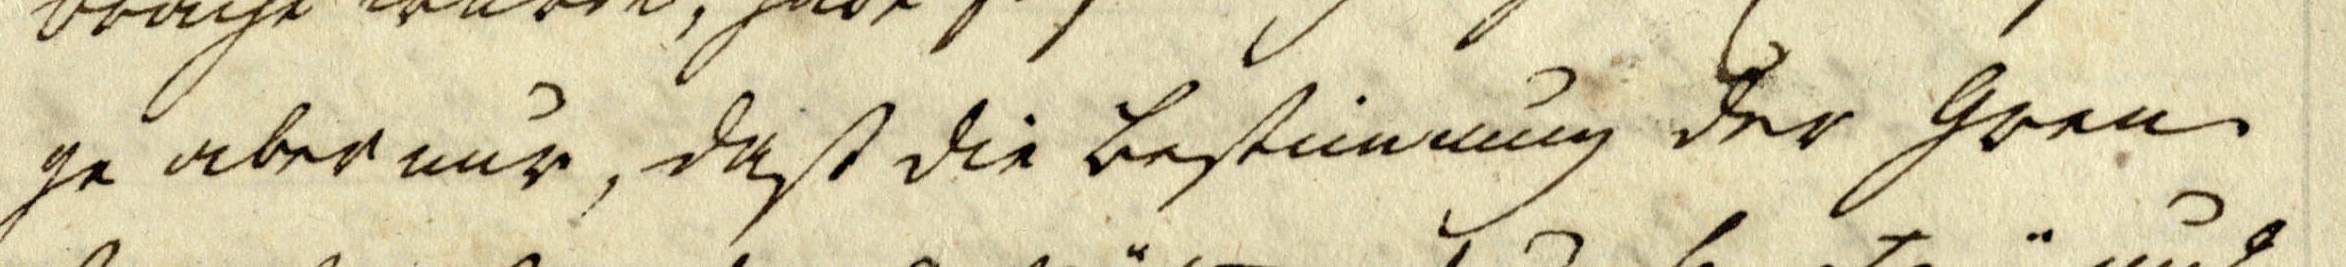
ge aber nur, daß die Bestimmung der Gren¬
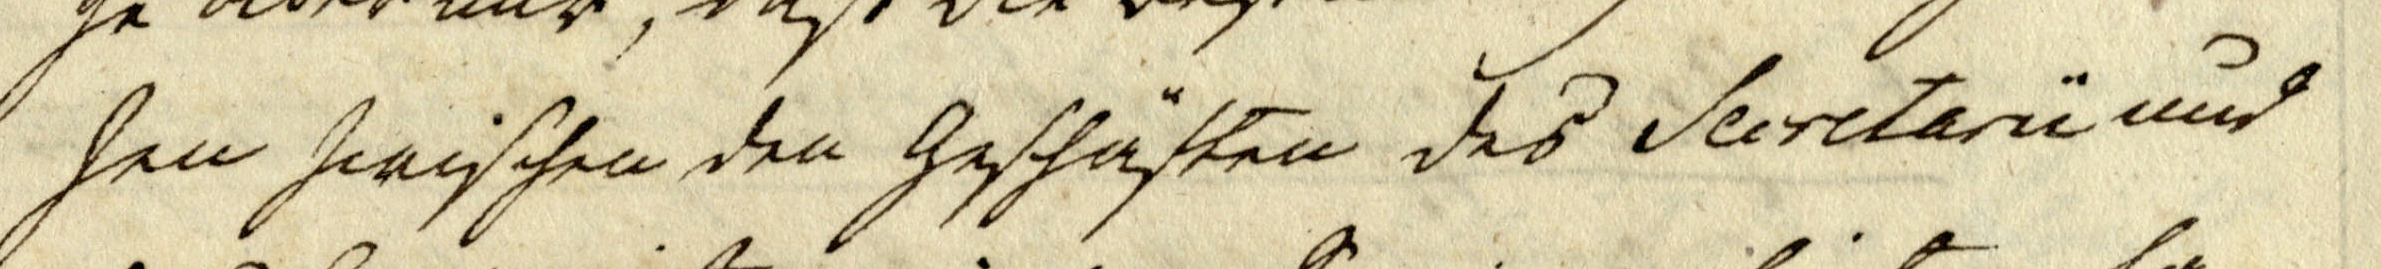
zen zwischen den Geschäften des Secretarii und
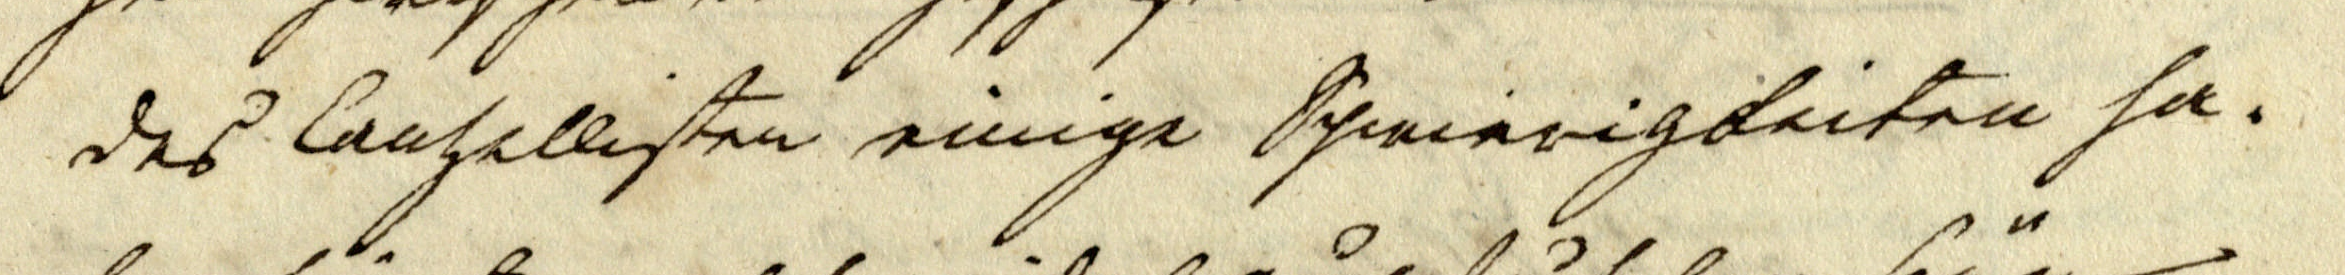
des Canzellisten einige Schwierigkeiten ha¬
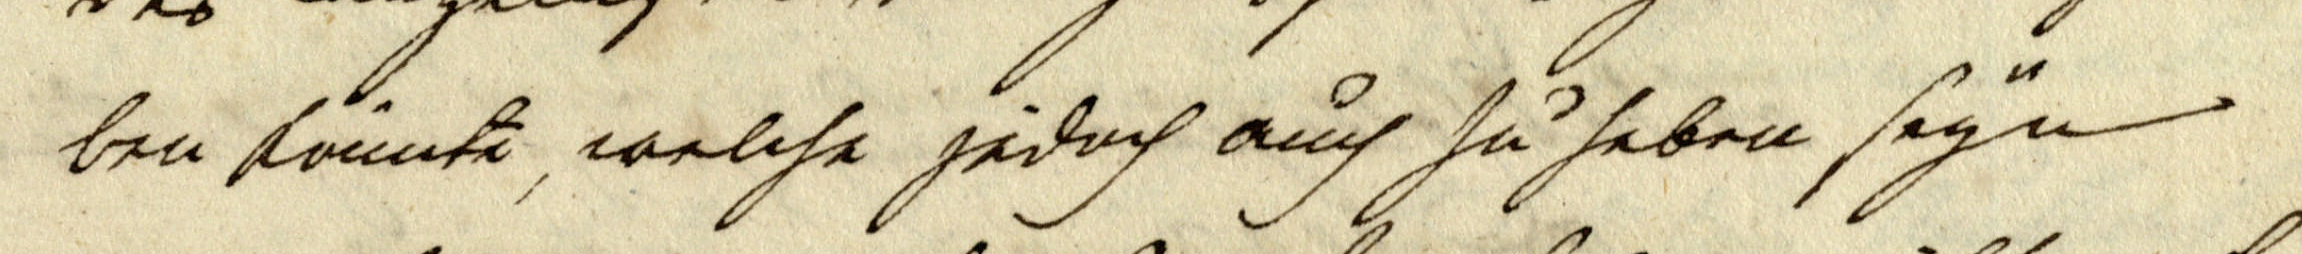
ben könnte, welche jedoch auch zu haben seÿn
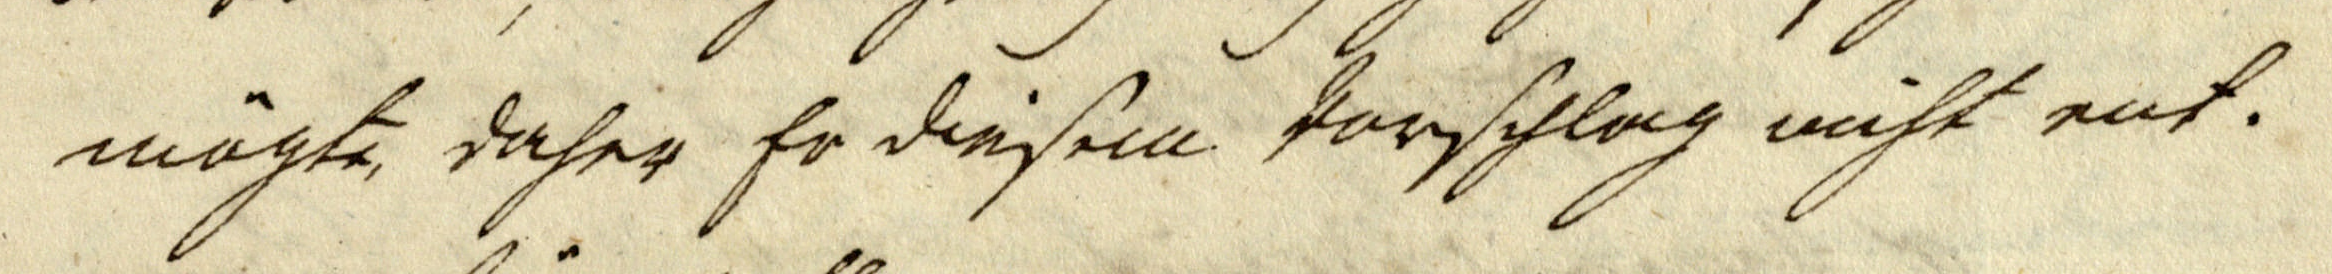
mögte, daher Er diesem Vorschlag nicht ent¬
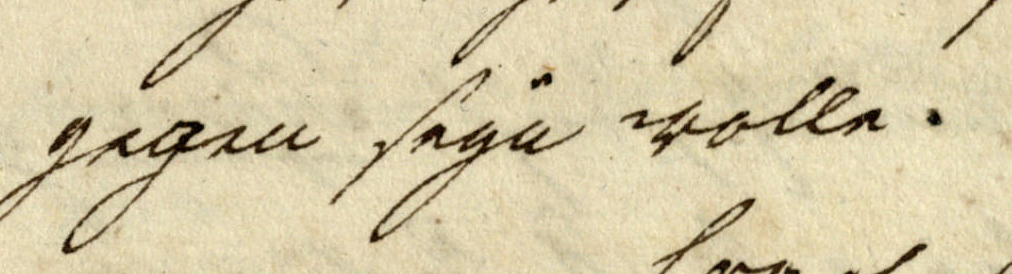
gegen seÿn wolle.
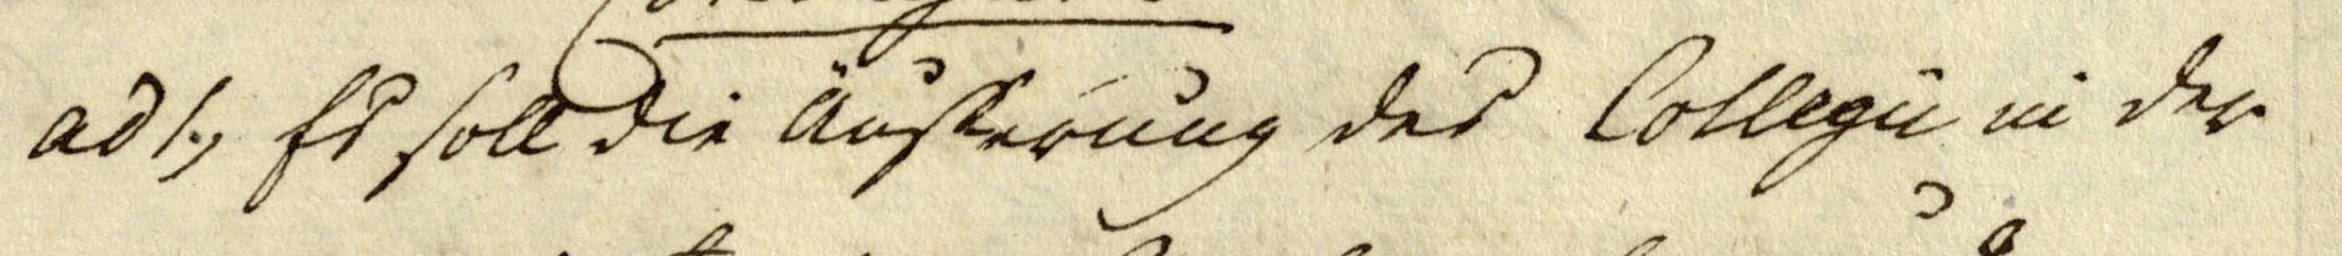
ad 1., Es soll die Äusserung des Collegii in der
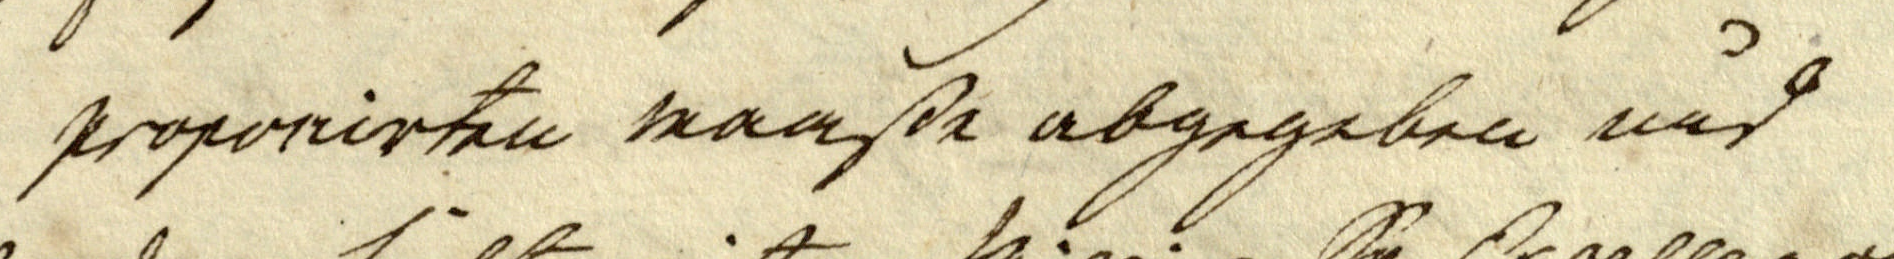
proponirten Maaße abgegeben und
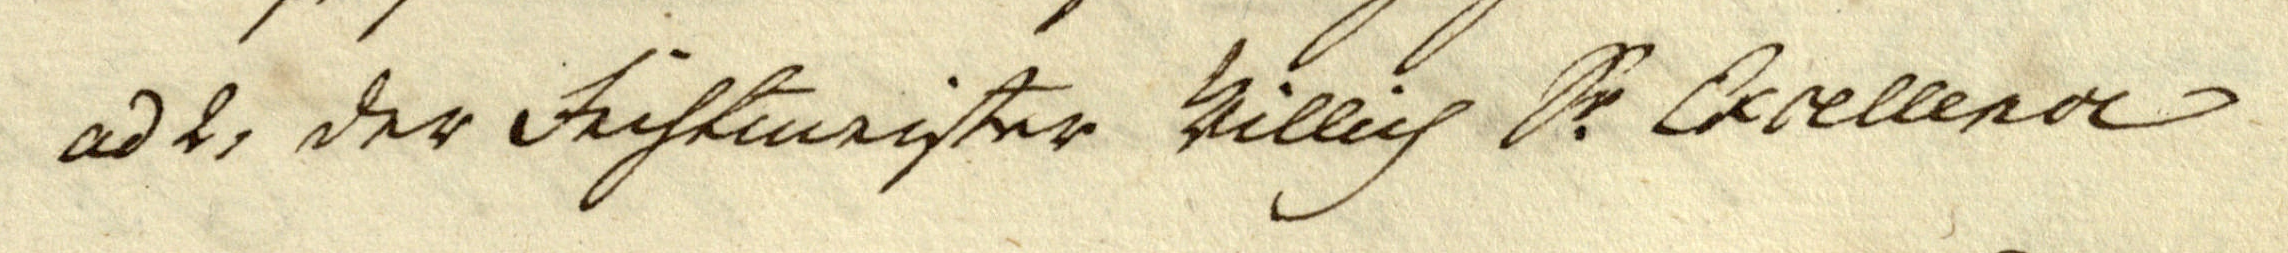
ad 2. der Fechtmeister Willich Sr Excellence
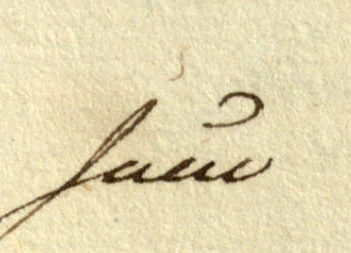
zum
